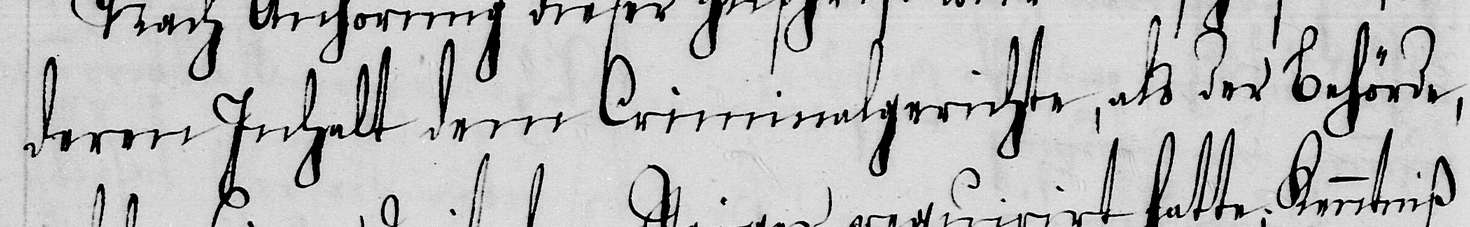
deren Inhalt dem Criminalgerichte, als der Behörde,
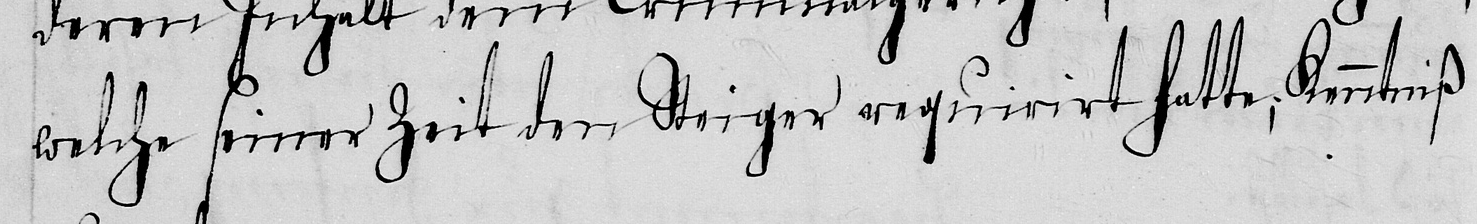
welche seiner Zeit den Steiger requirirt hatte, Kenntniß
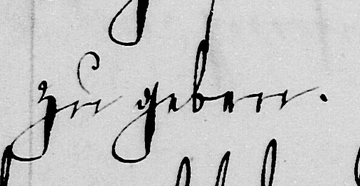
zu geben.
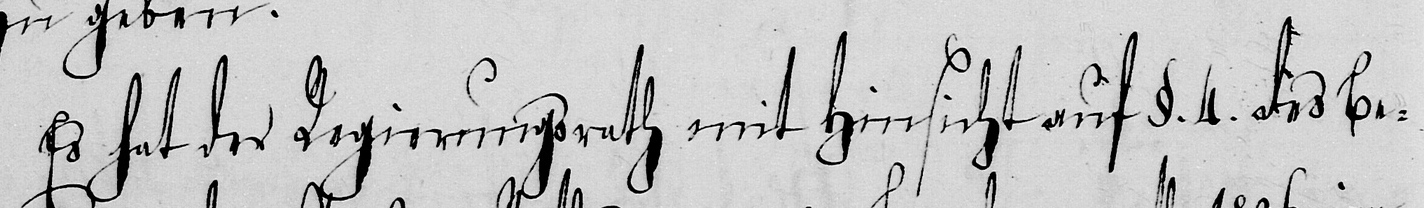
Es hat der Regierungsrath mit Hinsicht auf §. 4. des Be¬
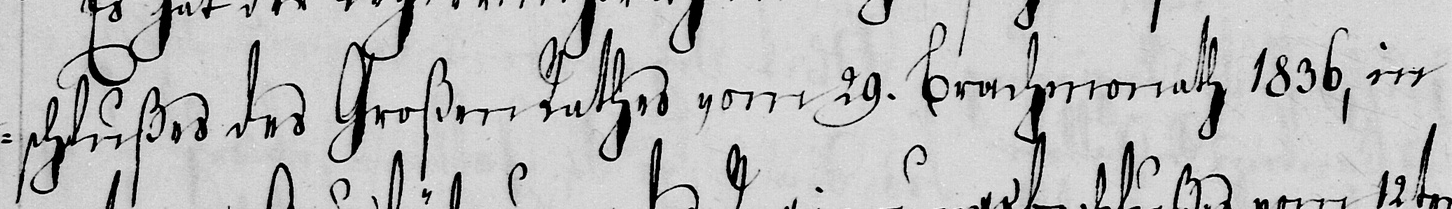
schlußes des Großen Rathes vom 29. Brachmonath 1836, in
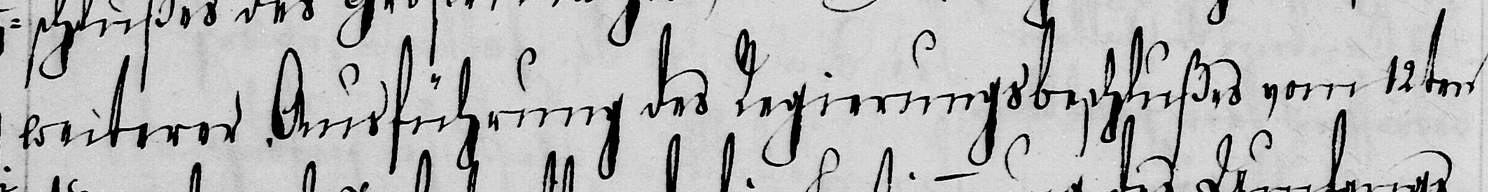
weiterer Ausführung des Regierungsbeschlußes vom 12ten
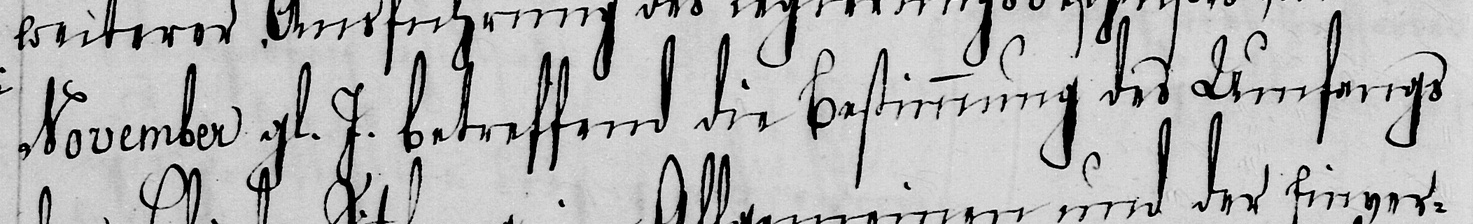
November gl. J. betreffend die Bestimmung des Umfangs
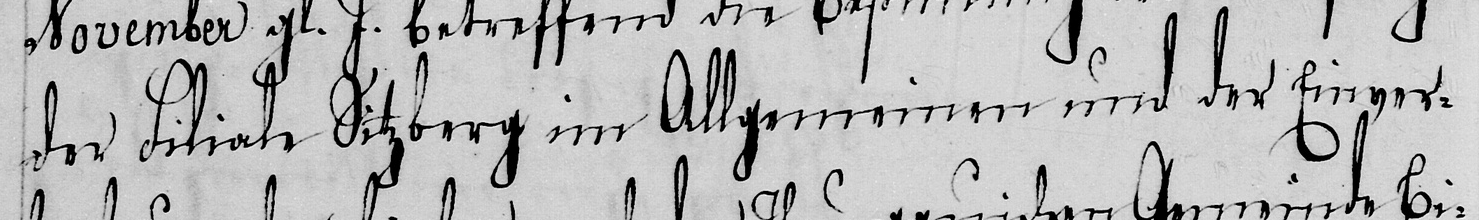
der Filiale Sitzberg im Allgemeinen und der Einver¬
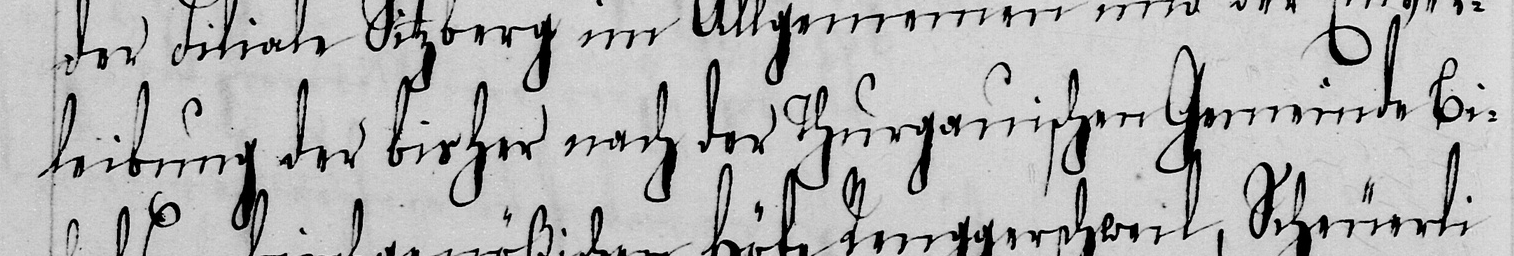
leibung der bisher nach der Thurgauischen Gemeinde Bi¬
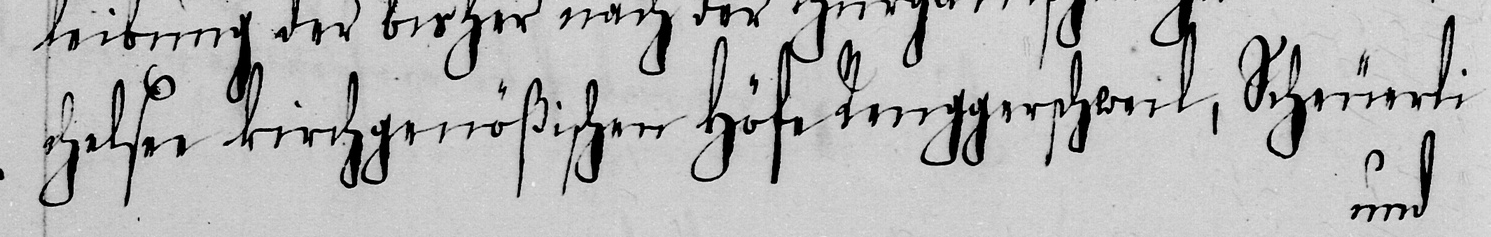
chelsee kirchgenößischen Höfe Renggerschweil, Scheuerli
